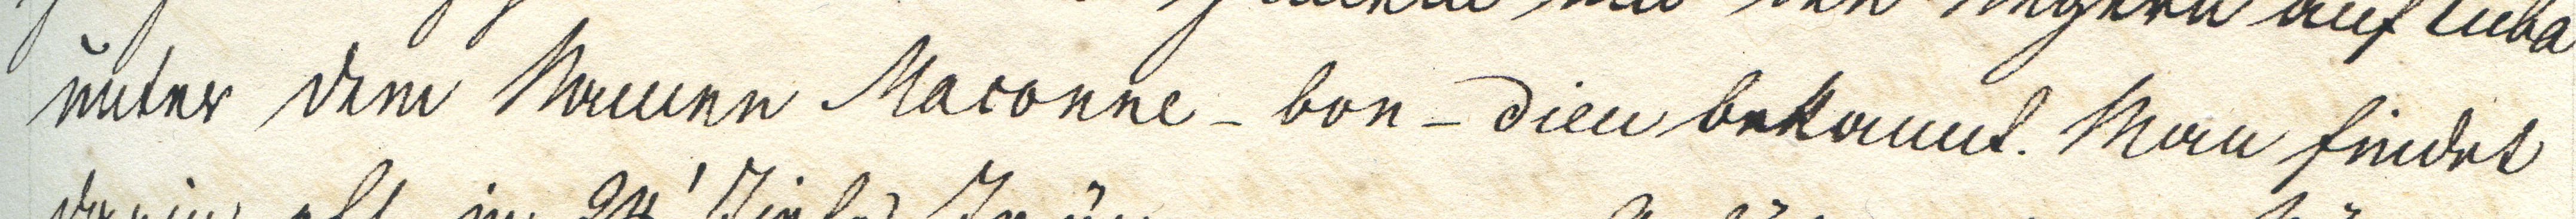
unter dem Namen Maconne-bon-dieu bekannt. Man findet
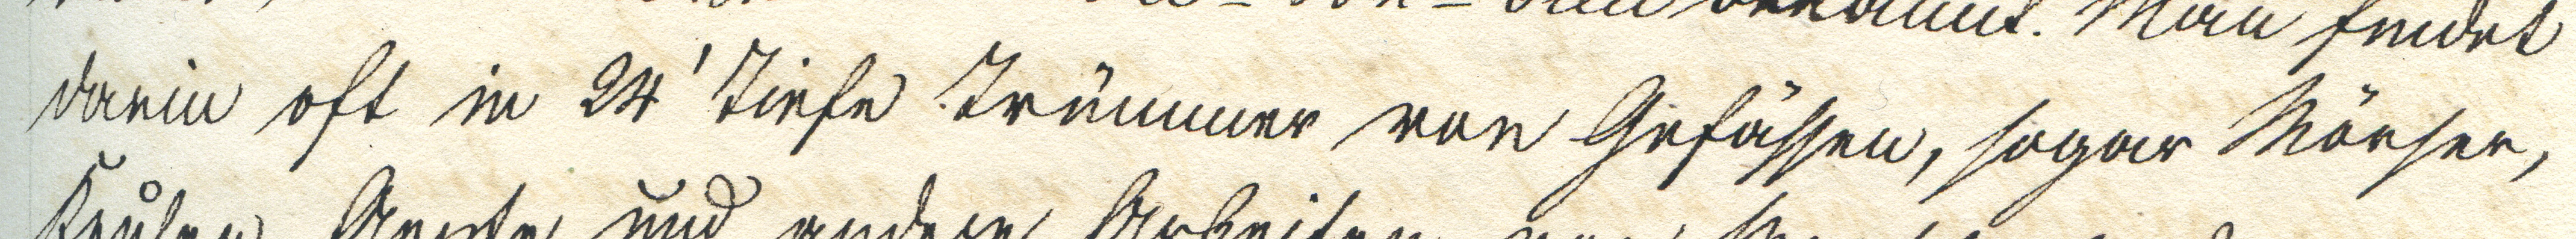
darin oft in 24′ Tiefe Trümmer von Gefässen, sogar Mörser,
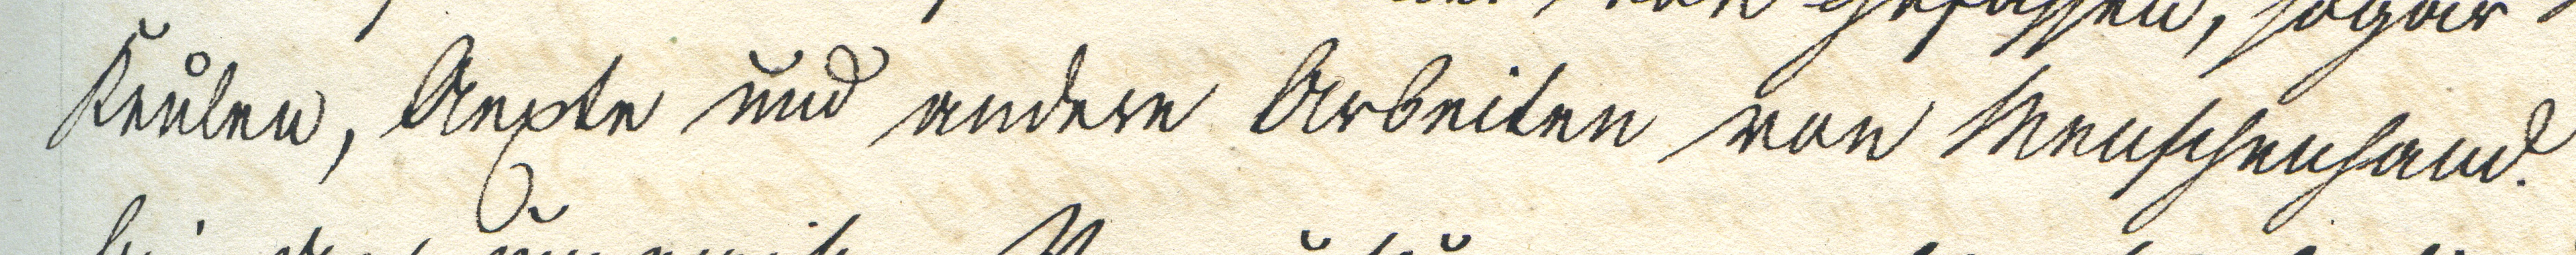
Keulen, Aexte und andere Arbeiten von Menschenhand.
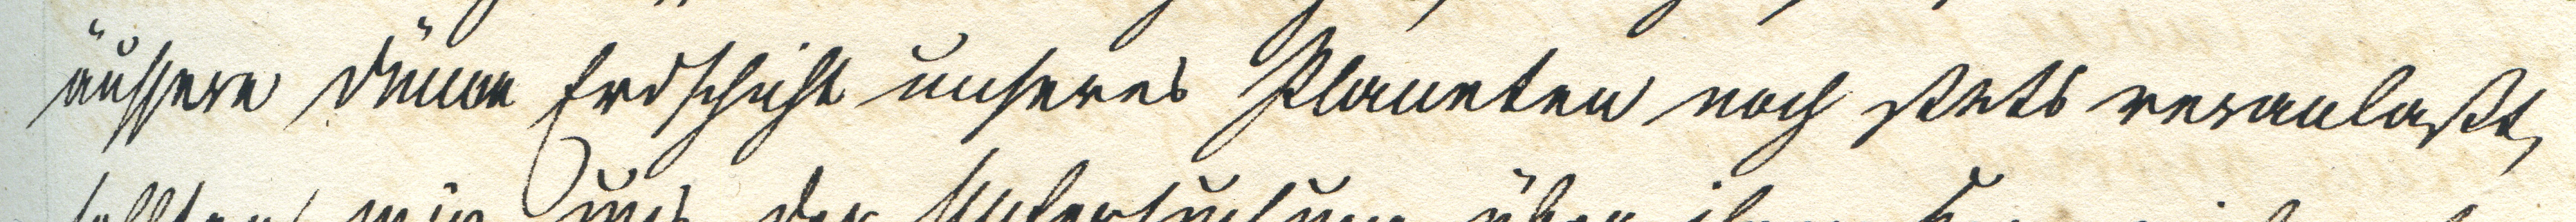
äussere dünne Erdschicht unseres Planeten noch stets veranlaßt,
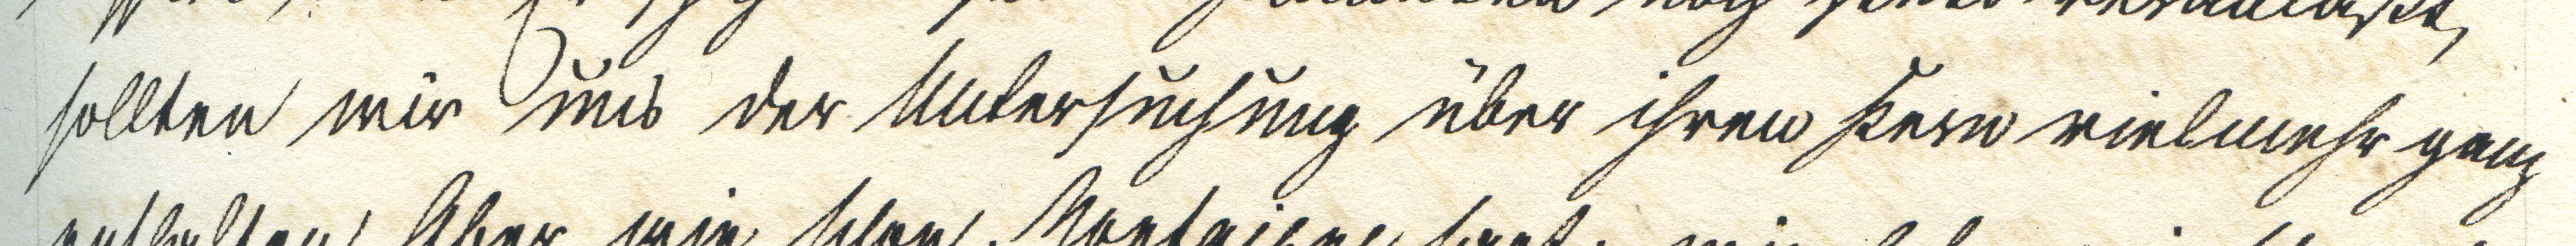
sollten wir uns der Untersuchung über ihren Kern vielmehr ganz
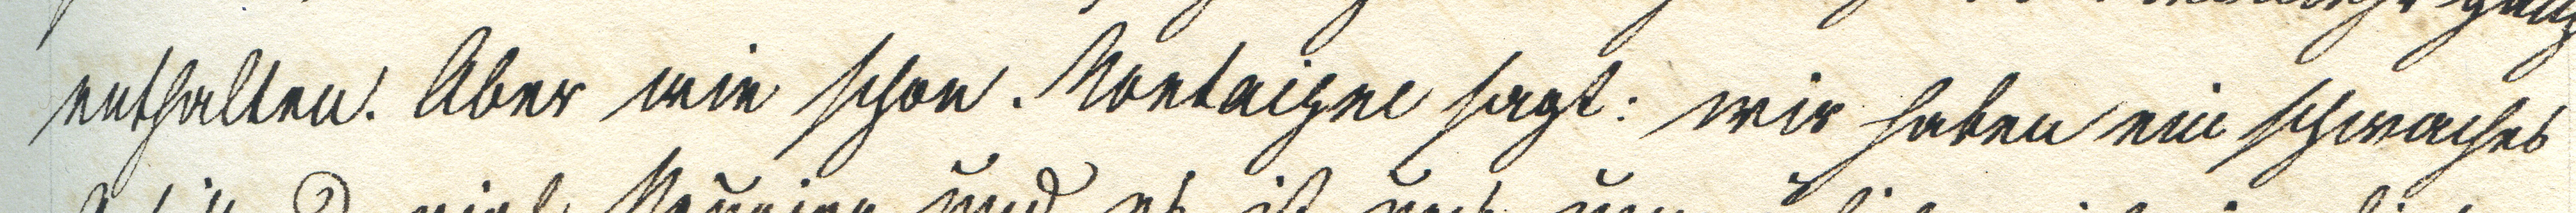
enthalten. Aber wie schon Montaigne sagt: wir haben ein schwaches
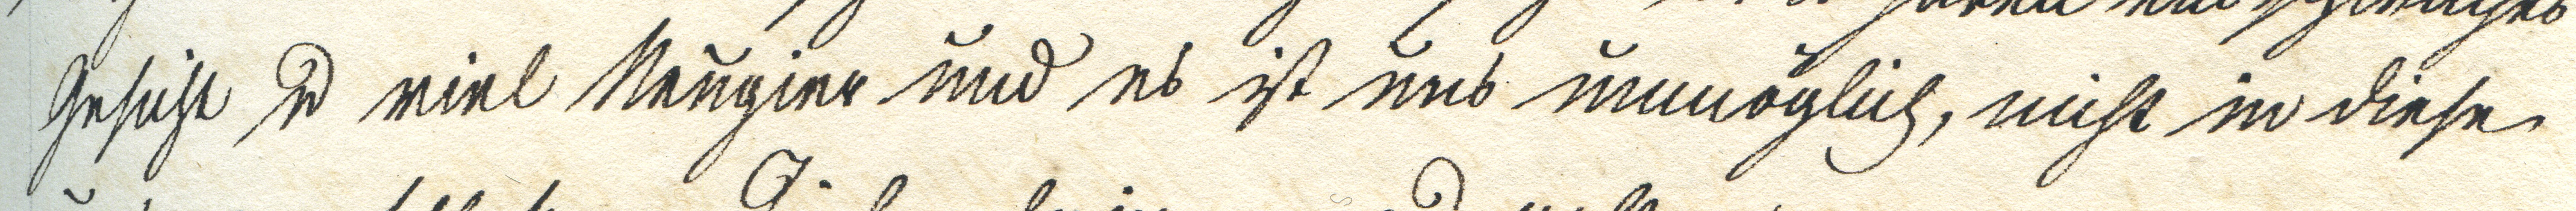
Gesicht u viel Neugier und es ist uns unmöglich, nicht in diese
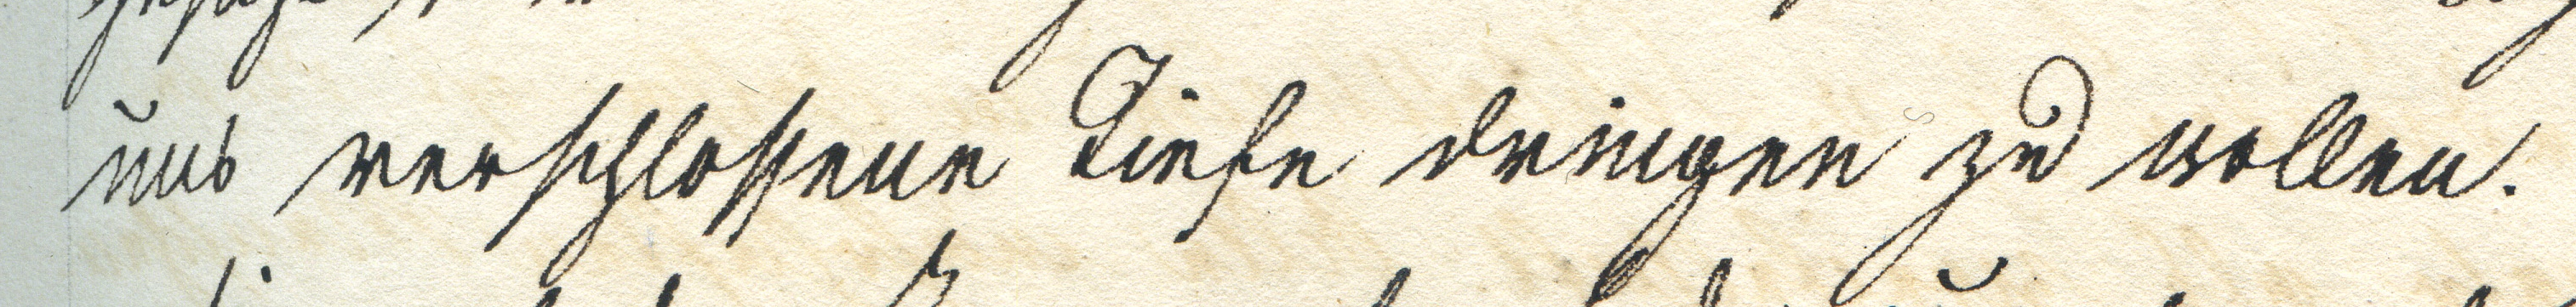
uns verschlossene Tiefe dringen zu wollen.
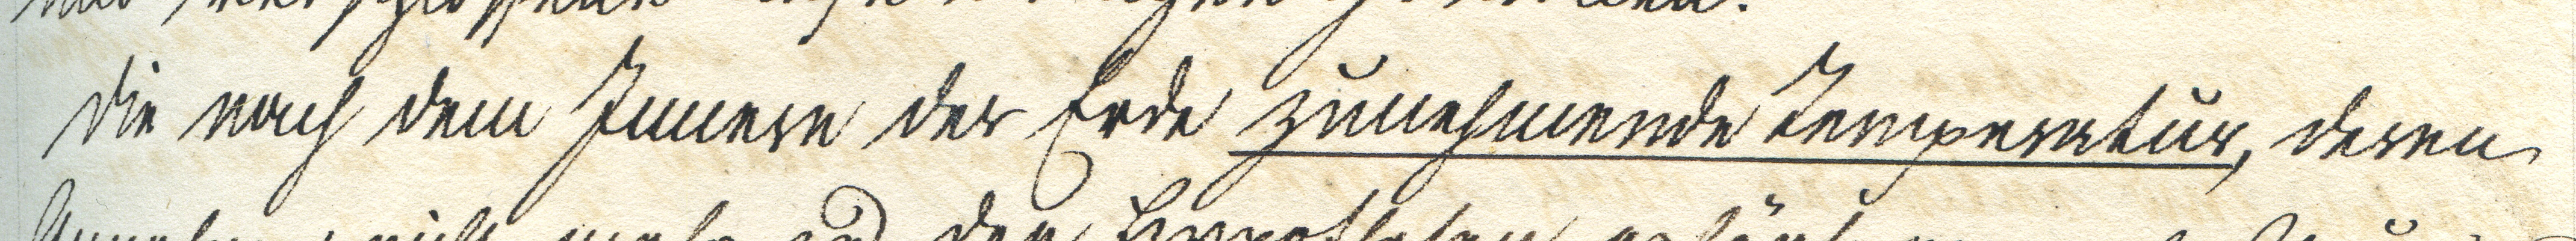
Die nach dem Innern der Erde zunehmende Temperatur, deren
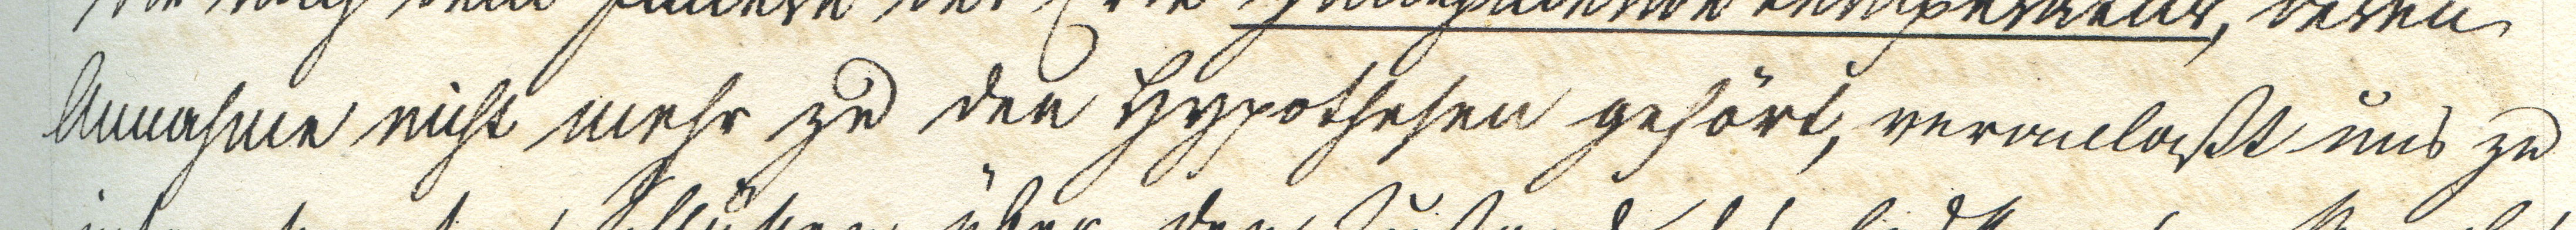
Annahme nicht mehr zu den Hypothesen gehört, veranlaßt uns zu
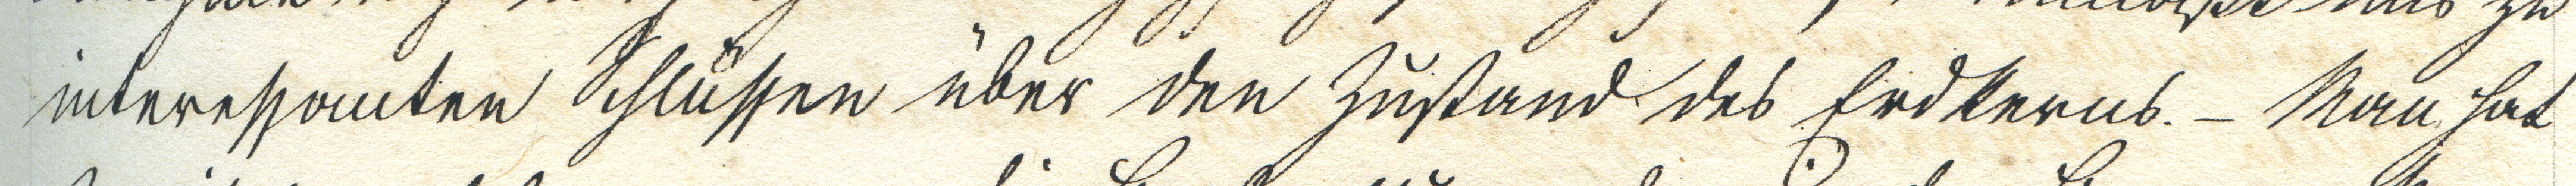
interressanten Schlüssen über den Zustand des Erdkerns. – Man hat
